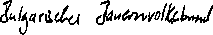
Bulgarischer Bauernvolksbund
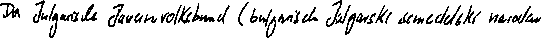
Der Bulgarische Bauernvolksbund (bulgarisch Balgarski semedelski naroden
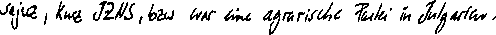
sajuz, kurz BZNS, bzw. war eine agrarische Partei in Bulgarien.
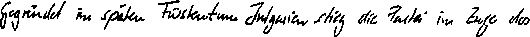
Gegründet im späten Fürstentum Bulgarien stieg die Partei im Zuge des
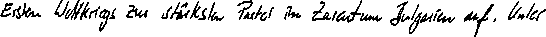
Ersten Weltkriegs zur stärksten Partei im Zarentum Bulgarien auf. Unter
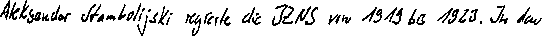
Aleksandar Stambolijski regierte die BZNS von 1919 bis 1923. In den
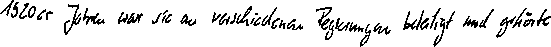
1930er Jahren war sie an verschiedenen Regierungen beteiligt und gehörte
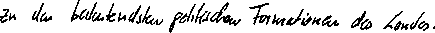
zu den bedeutendsten politischen Formationen des Landes.
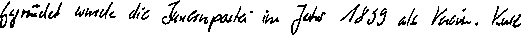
Gegründet wurde die Bauernpartei im Jahr 1899 als Verein. Kurz
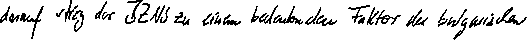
darauf stieg der BZNS zu einem bedeutenden Faktor der bulgarischen
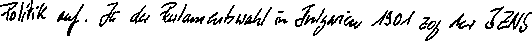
Politik auf. Bei der Parlamentswahl in Bulgarien 1901 zog der BZNS
